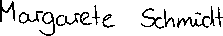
Margarete Schmidt
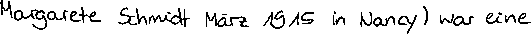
Margarete Schmidt März 1915 in Nancy) war eine
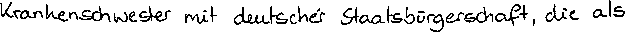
Krankenschwester mit deutscher Staatsbürgerschaft, die als
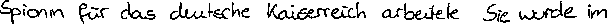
pionin für das Deutsche Kaiserreich arbeitete. Sie wurde im
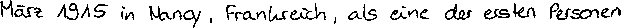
März 1915 in Nancy, Frankreich, als eine der ersten Personen
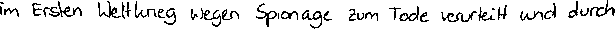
im Ersten Weltkrieg wegen Spionage zum Tode verurteilt und durch
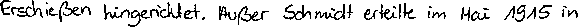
Erschießen hingerichtet. Außer Schmidt ereilte im Mai 1915 in
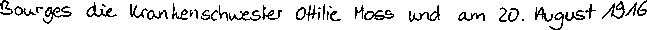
Bourges die Krankenschwester Ottilie Moss und am 20. August 1916
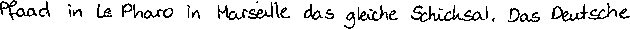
Pfaad in Le Pharo in Marseille das gleiche Schicksal.Das Deutsche
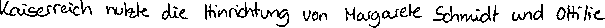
Kaiserreich nutzte die Hinrichtung von Margarete Schmidt und Ottilie
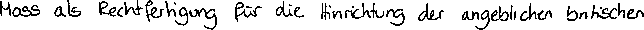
Moss als Rechtfertigung für die Hinrichtung der angeblichen britischen
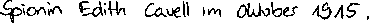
Spionin Edith Cavell im Oktober 1915.
